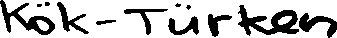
Kök-Türken
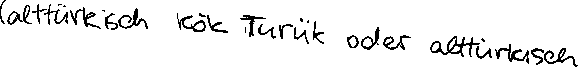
(alttürkisch Kök Türük oder alttürkisch
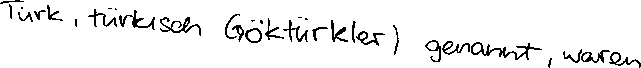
Türk, türkisch: Göktürkler) genannt, waren
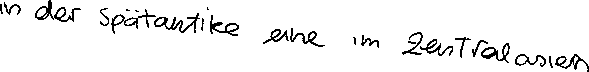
in der Spätantike eine in Zentralasien
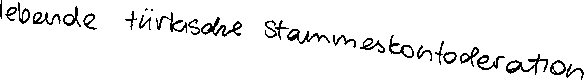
lebende türkische Stammeskonföderation
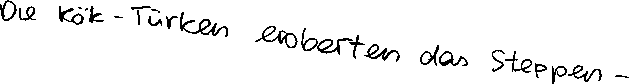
Die Kök-Türken eroberten das Steppen-
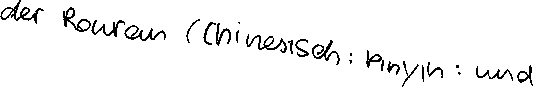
der Rouran (Chinesisch: Pinyin: und
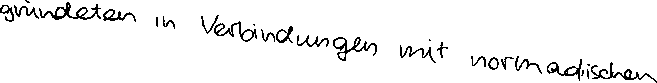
gründeten in Verbindung mit nomadischen
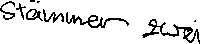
Stämmen zwei
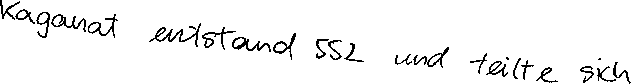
Kaganat entstand 552 und teilte sich
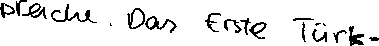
Das Erste Türk-
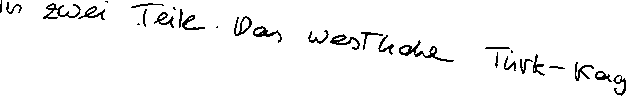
in zwei Teile: Das westliche Türk-Kag
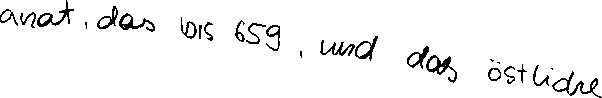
nat, das bis 659, und das östliche
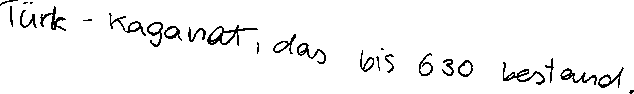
Türk-Kaganat, das bis 630 bestand.
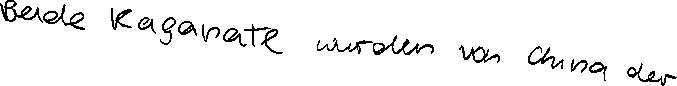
Beide Kaganate wurden vom China der
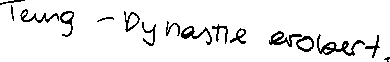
Tang-Dynastie erobert.
